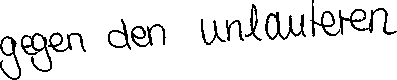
gegen den unlauteren
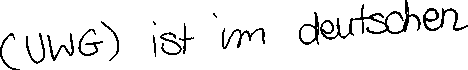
(UWG) ist im deutschen
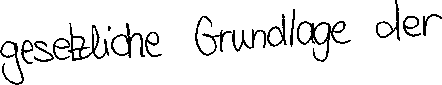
gesetzliche Grundlage der
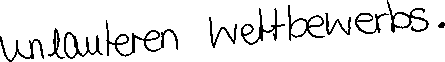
unlauteren Wettbewerbs.
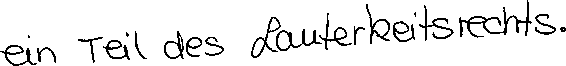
ein Teil des Lauterkeitsrechts.
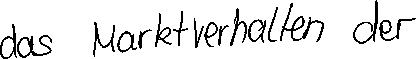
das Marktverhalten der
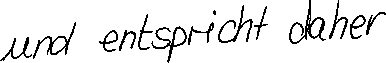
und entspricht daher
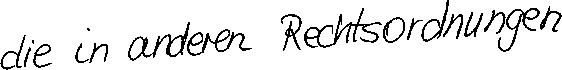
die in anderen Rechtsordnungen
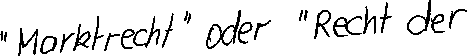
"Marktrecht" oder "Recht der
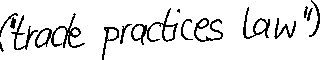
("trade practices law")
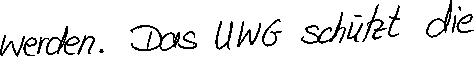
werden.Das UWG schützt die
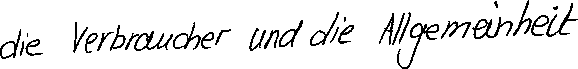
die Verbraucher und die Allgemeinheit
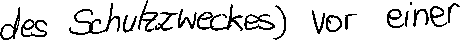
des Schutzzweckes) vor einer
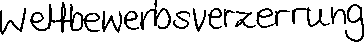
Wettbewerbsverzerrung
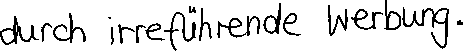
durch irreführende Werbung.
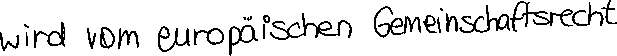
wird vom europäischen Gemeinschaftsrecht
